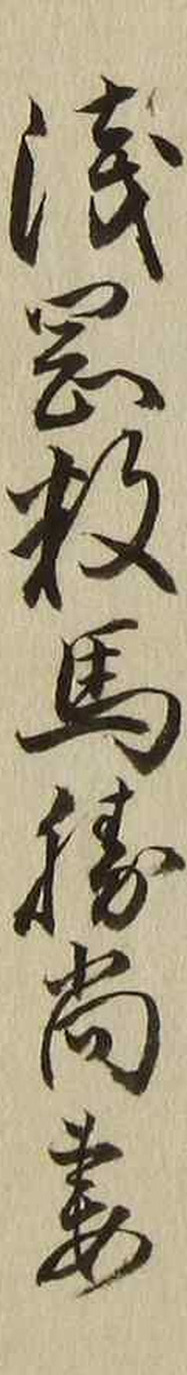女浅岡数馬勝尚妻
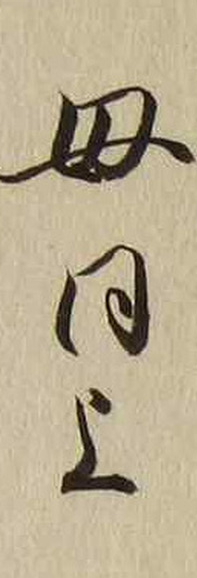母同上

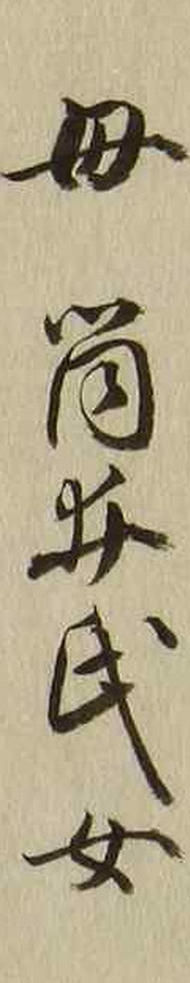母筒井氏女
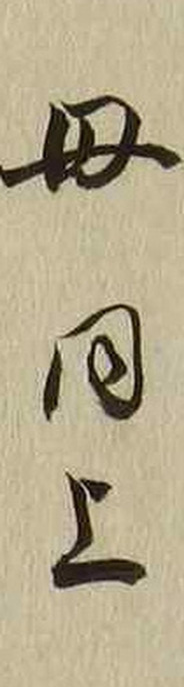母同上
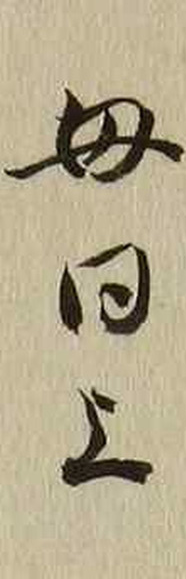母同上
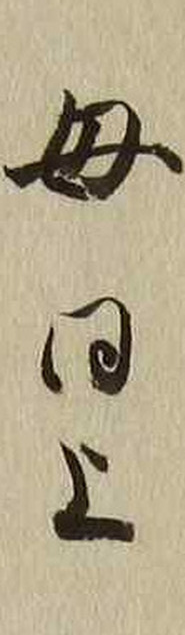母同上
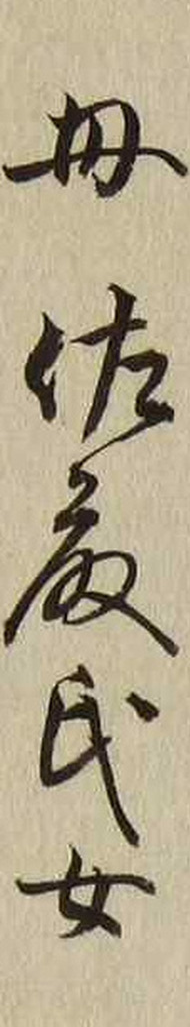母佐藤氏女
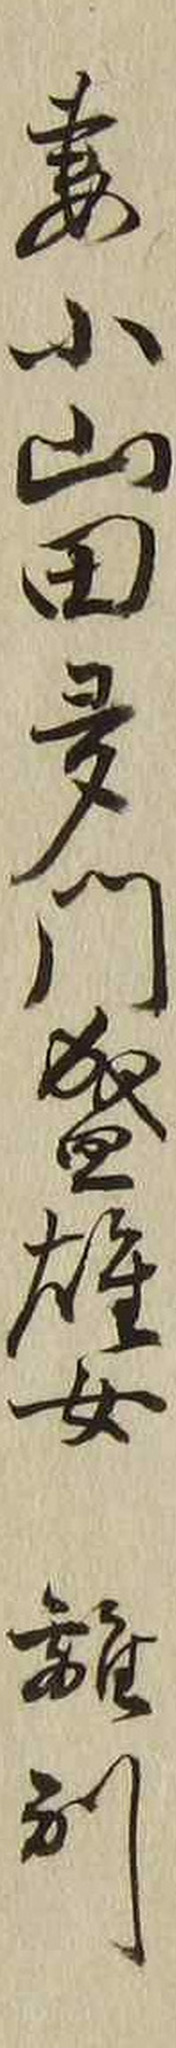妻小山田多門盛雄女離別
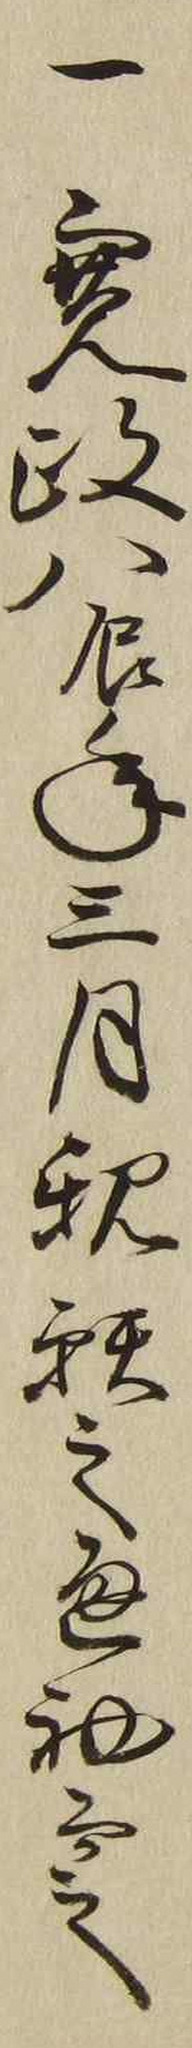一寛政八辰年三月親願之通初而之

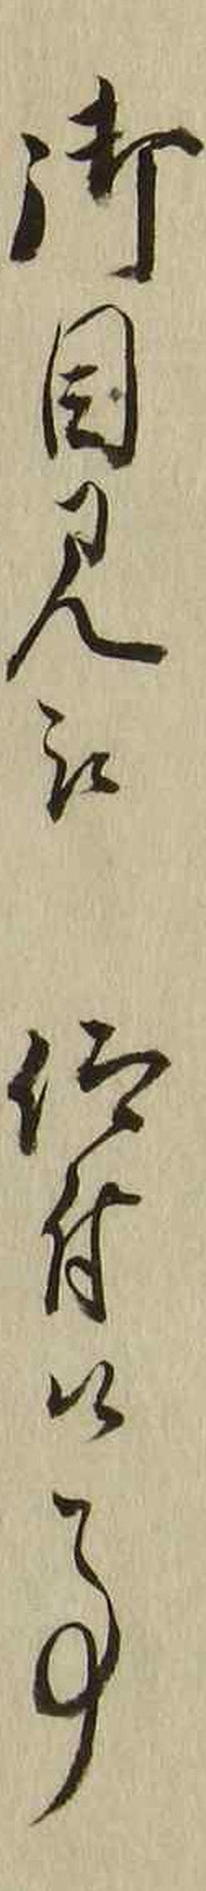御目見被仰付候事
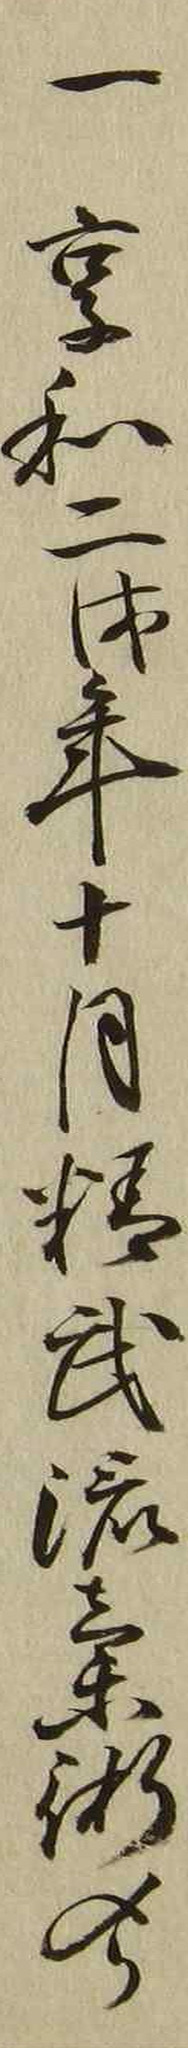一享和二戌年十月精武流気術〆り
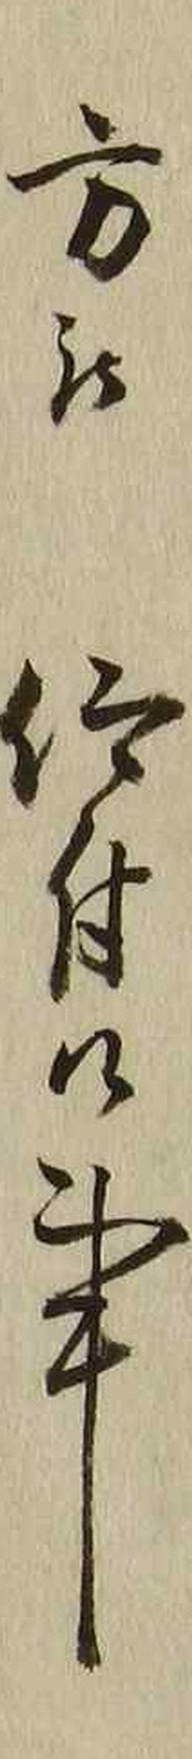方被仰付候事
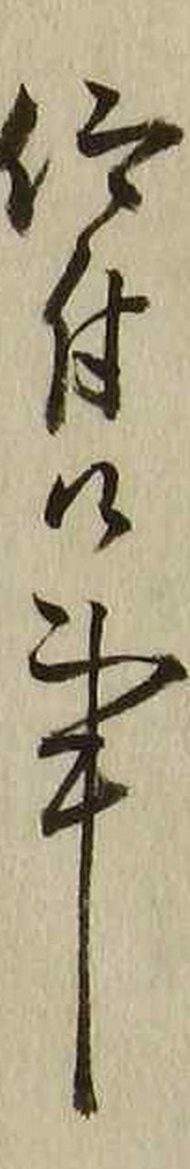仰付候事
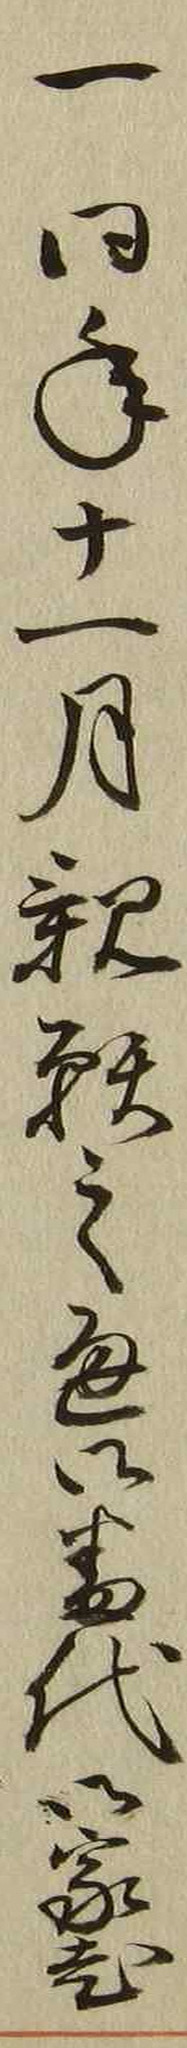一同年十一月親願之通御番代御家老
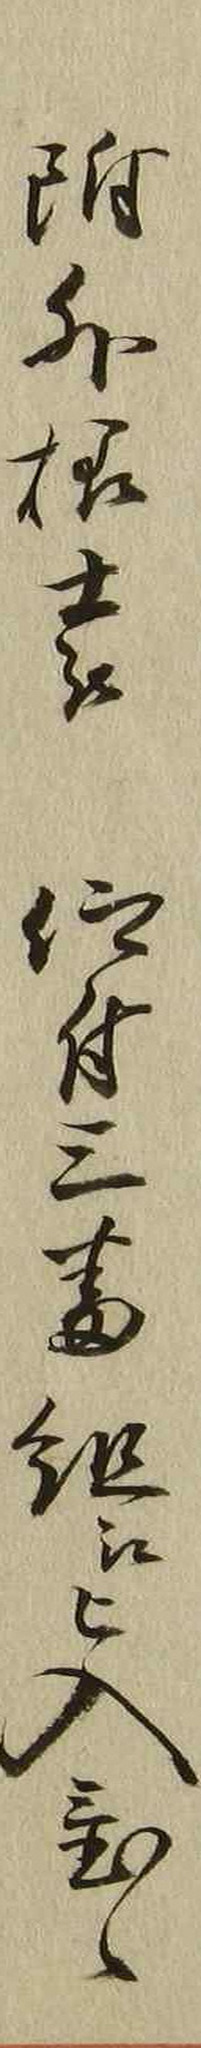附外様士被仰付三番組江被入置候
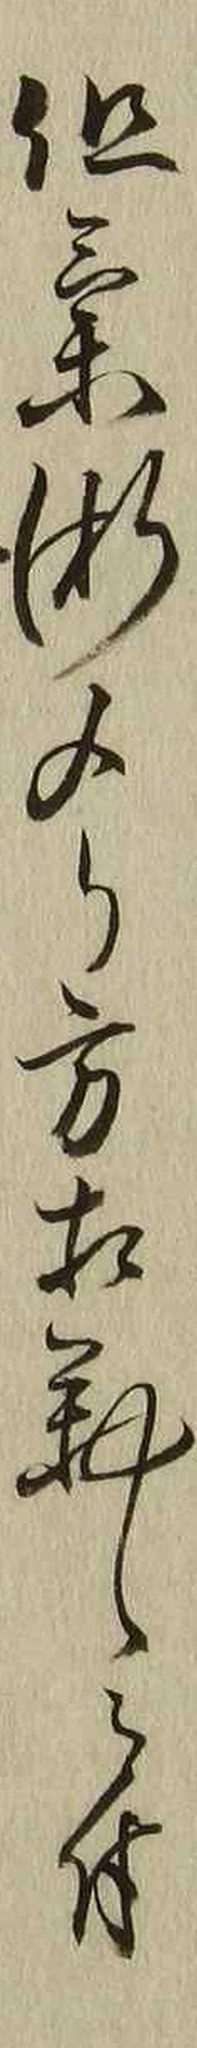但気術〆り方相勤候ニ付
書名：諸士系譜　巻之60　と之部3
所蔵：会津若松市立会津図書館
